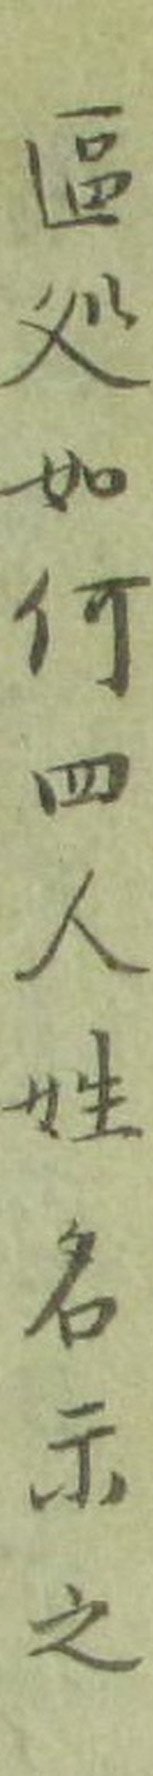区処如何四人姓名示之鳴
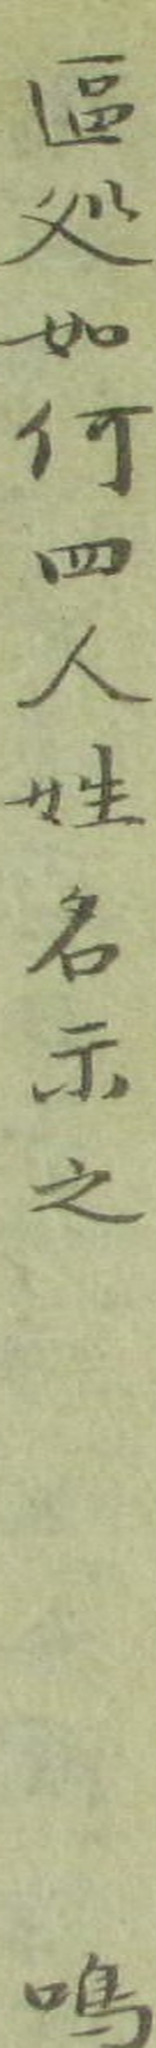区処如何四人姓名示之鳴
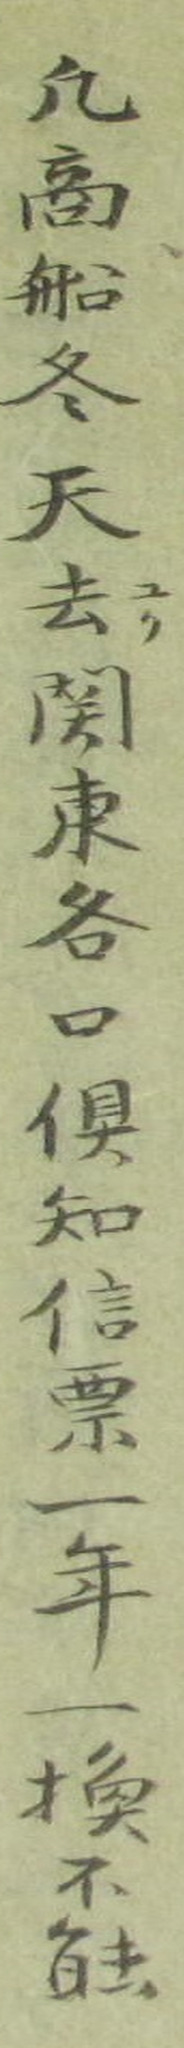凡商船冬天去関東各口俱知信票一年一換不能
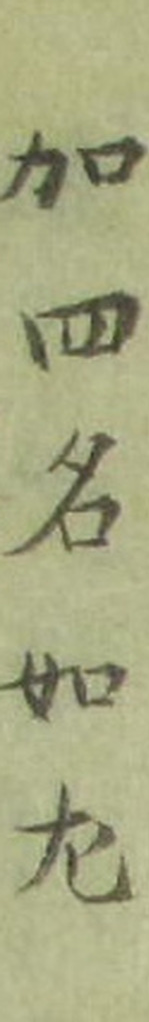加四名如左王
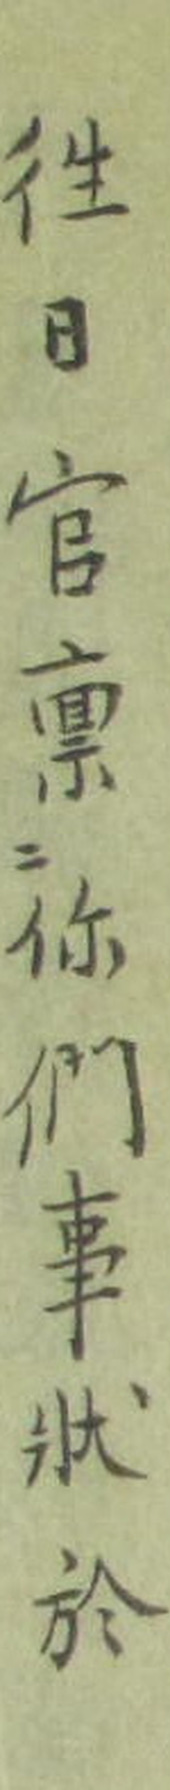往日官稟你們事状於

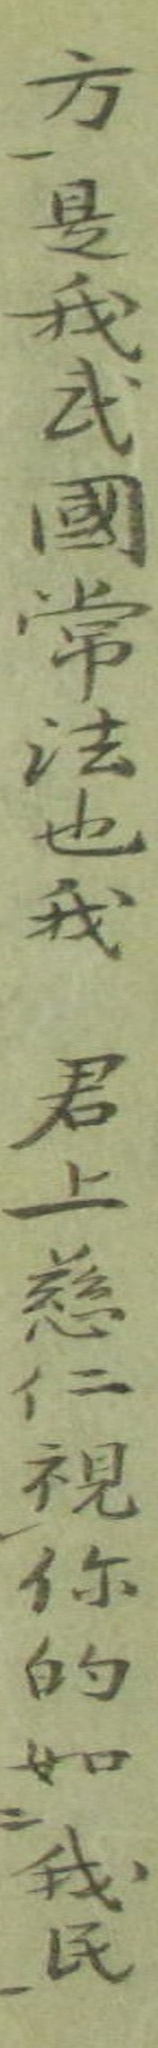方是我武国常法也我君上慈仁視你的如我民
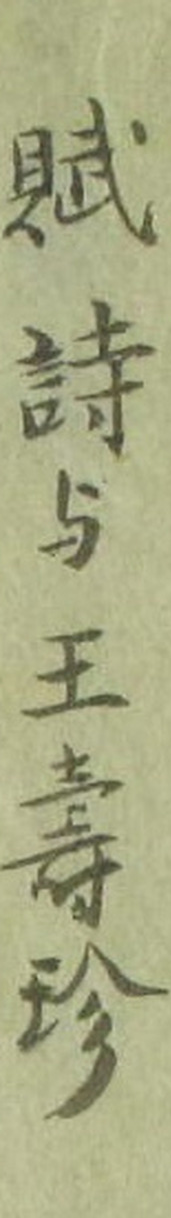賦詩与王寿珍
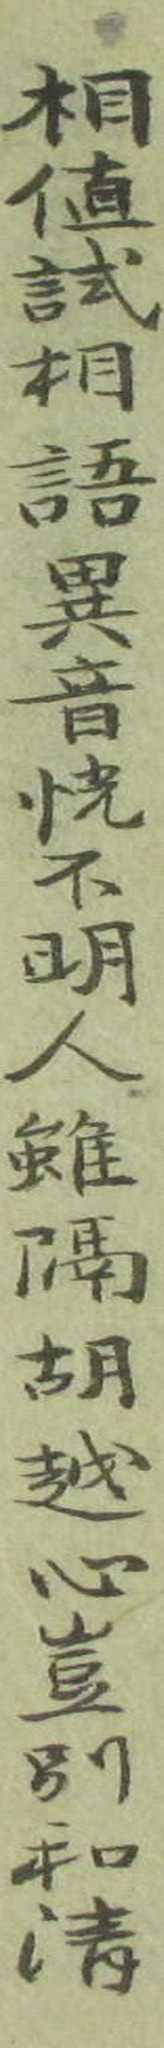相値試相語異音恍不明人雖隔胡越心豈別和清
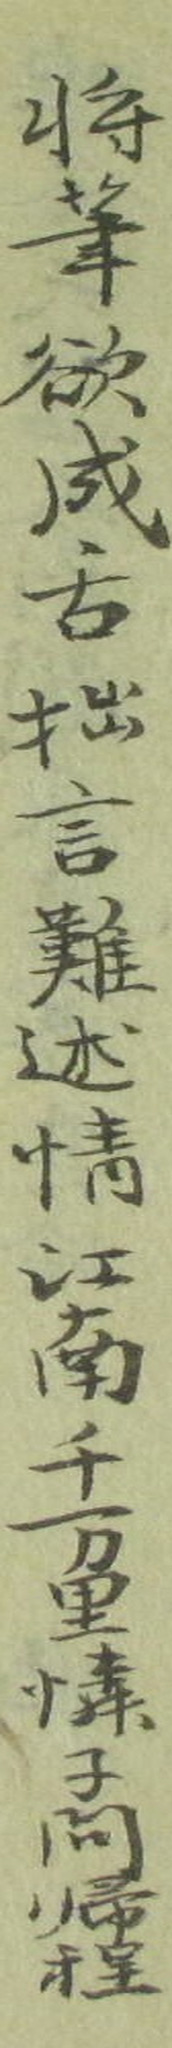将筆欲成舌拙言難述情江南千万里憐子問帰程
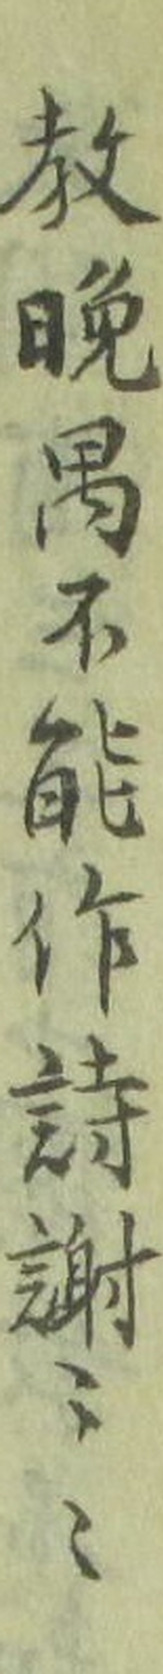教晩禺不能作詩謝々々王
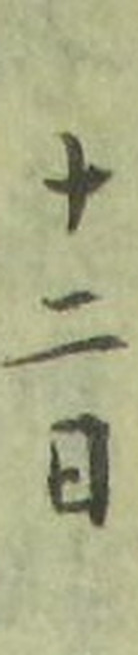十二日
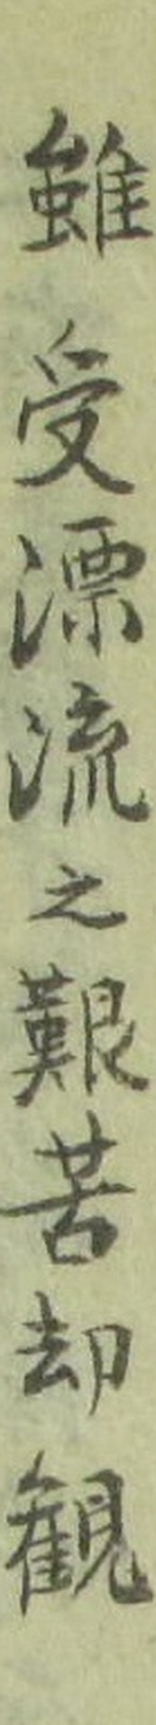雖受漂流之艱苦却観
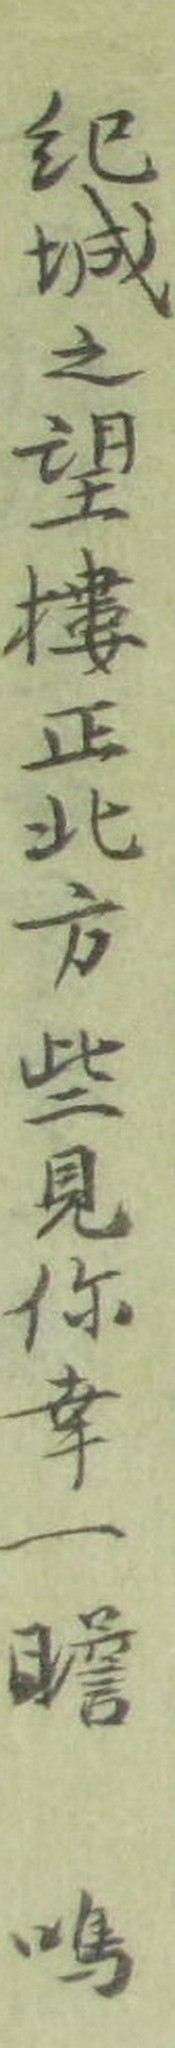紀城之望楼正北方些見你幸一胆鳴
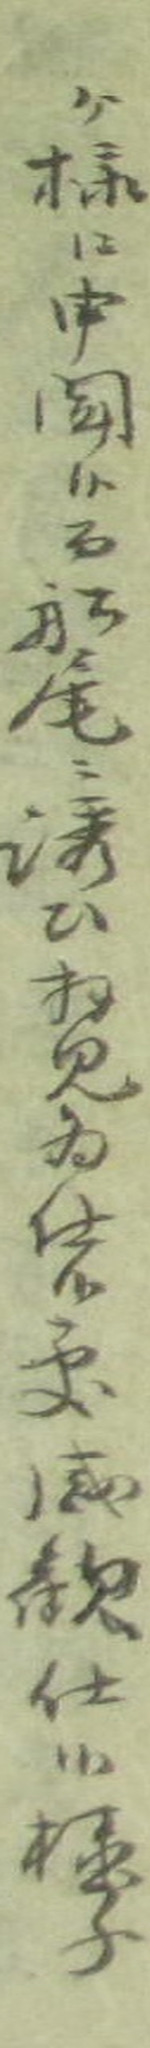ケ様に申聞候而船尾ニ誘ひ拝見為仕候処感歎仕候様子
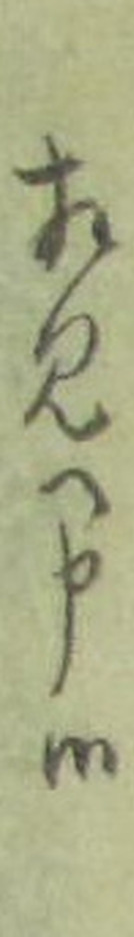相見へ申候

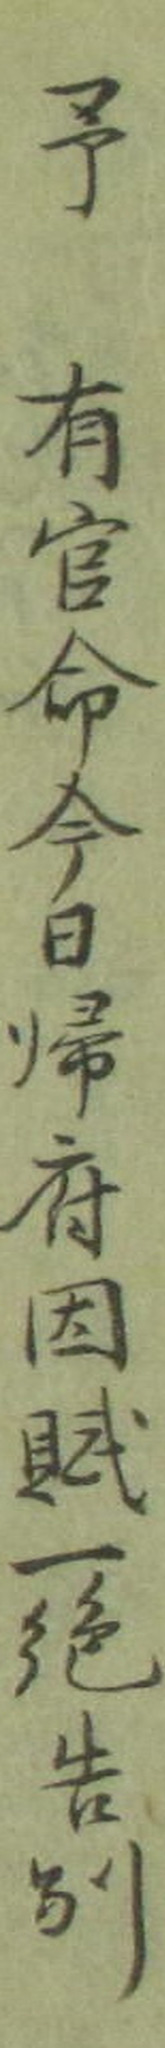予有官命今日帰府因賦一絶告別
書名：紀州九木浦庄屋記録 四
